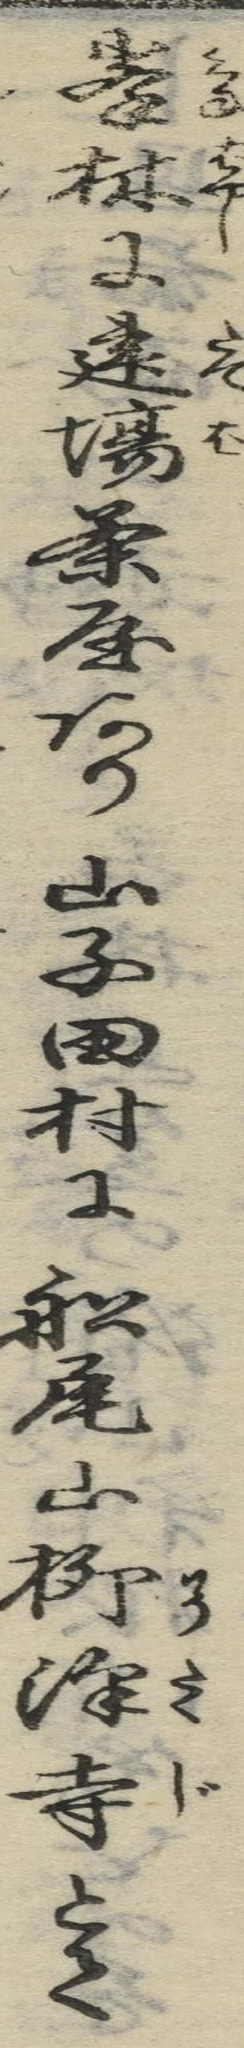峯林に建場茶屋あり山子田村に船尾山柳澤寺とて
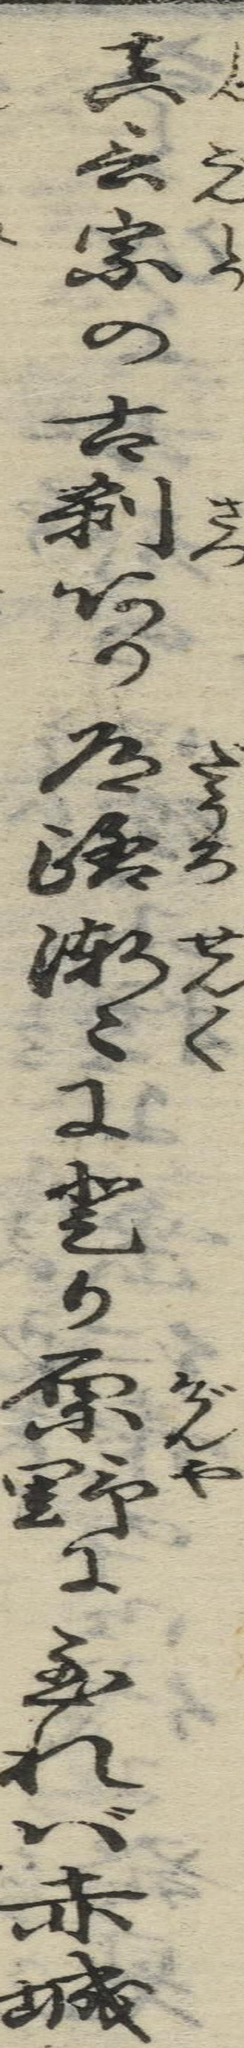真言宗の古刹あり道路漸々に登り原野に至れば赤城
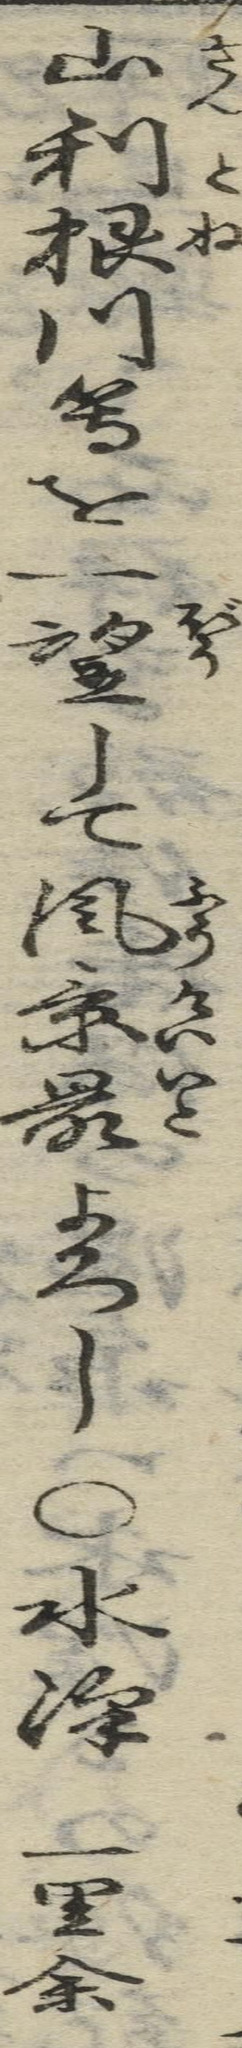山利根川等を一望して風景最よろし○水澤一里余
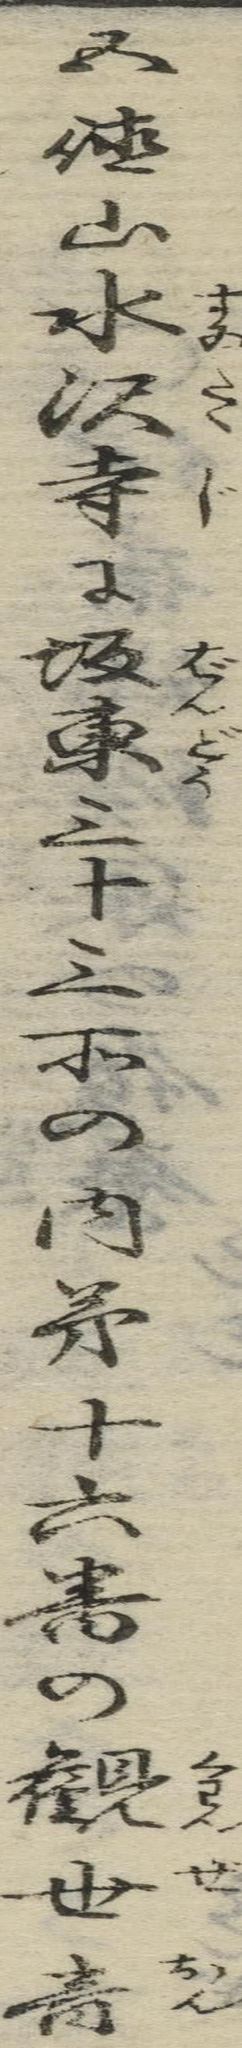五徳山水沢寺に坂東三十三所の内第十六番の観世音
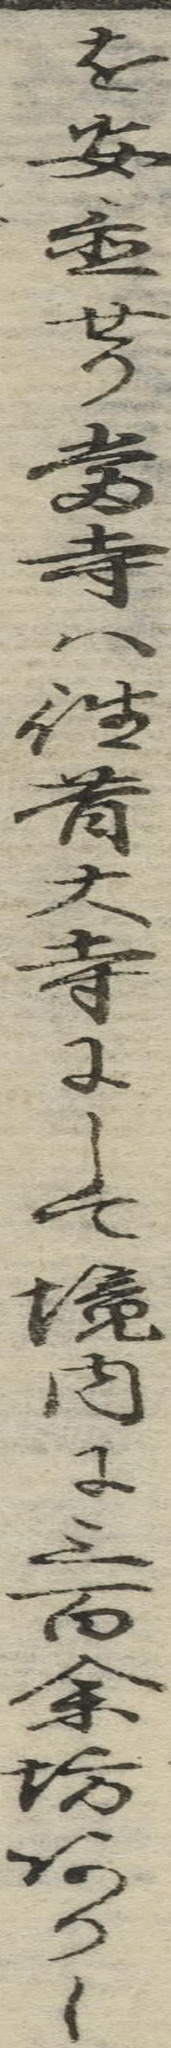を安置せり當寺は往昔大寺にして境内に三百余坊ありし
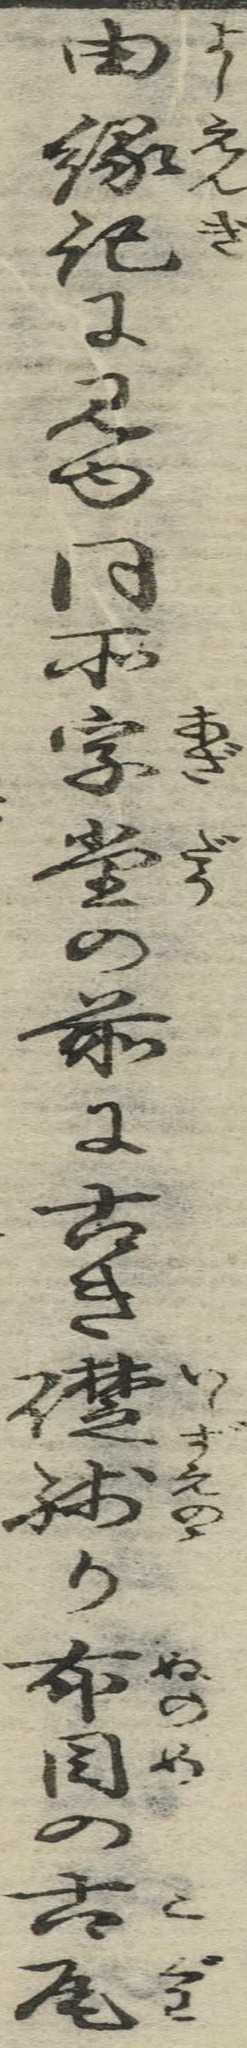由縁起に見ゆ同所字堂の前に古き礎残り布目の古瓦
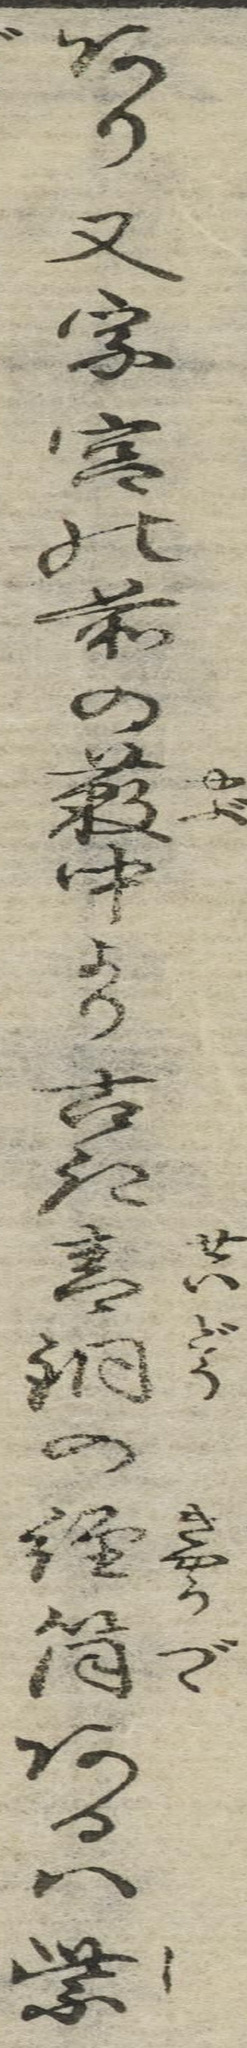あり又字宮の前の薮中より古き青銅の経筒あるは紫
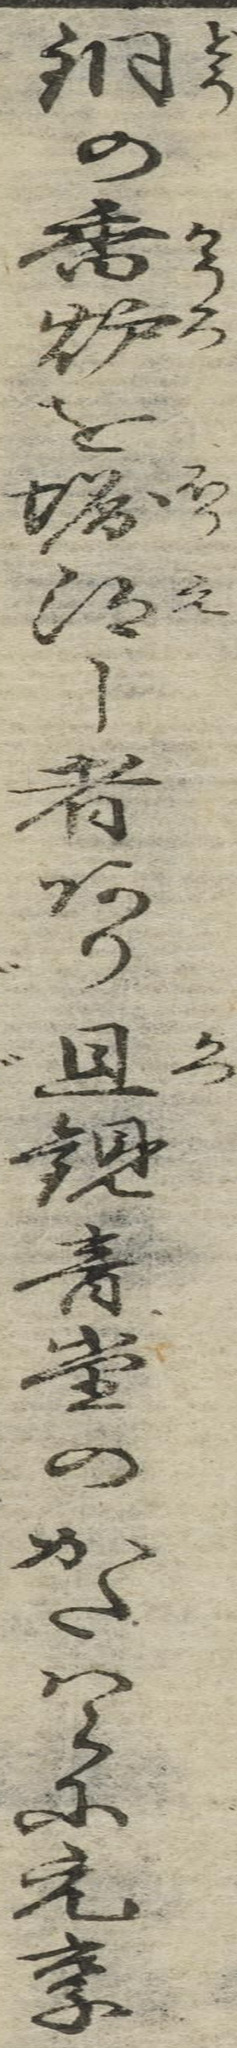銅の香炉を堀得し者あり且観音堂のかたはらに元慶
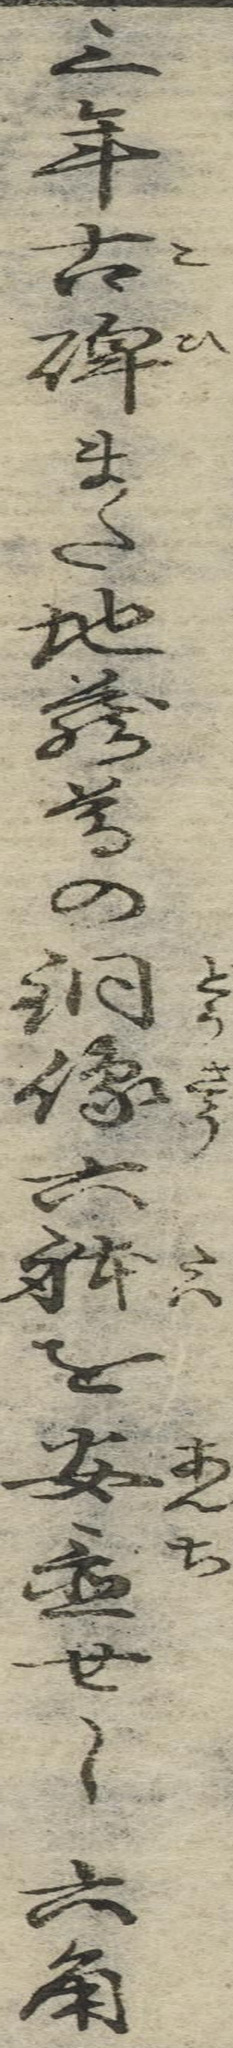三年古碑また地蔵尊の銅像六躰を安置せし六角
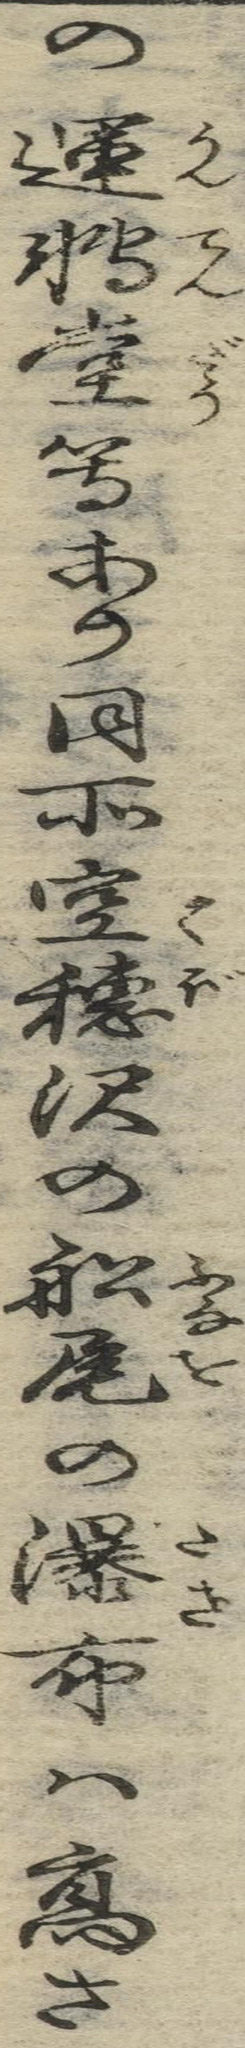の運転堂等あり同所空穂澤の船尾の瀑布は高さ

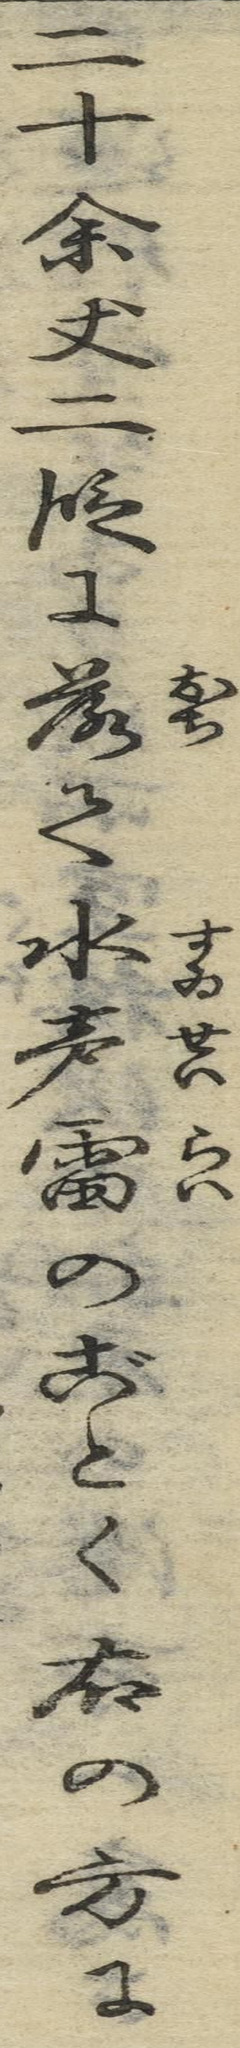二十余丈二段に落て水声雷のごとく右の方に
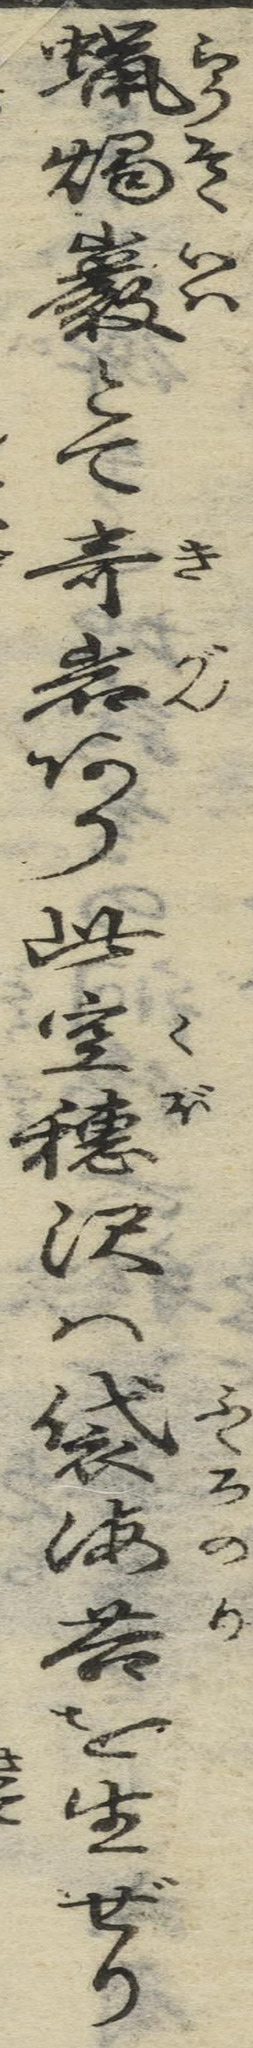蝋燭巌とて奇岩なり此空穂沢は袋海苔生ぜり
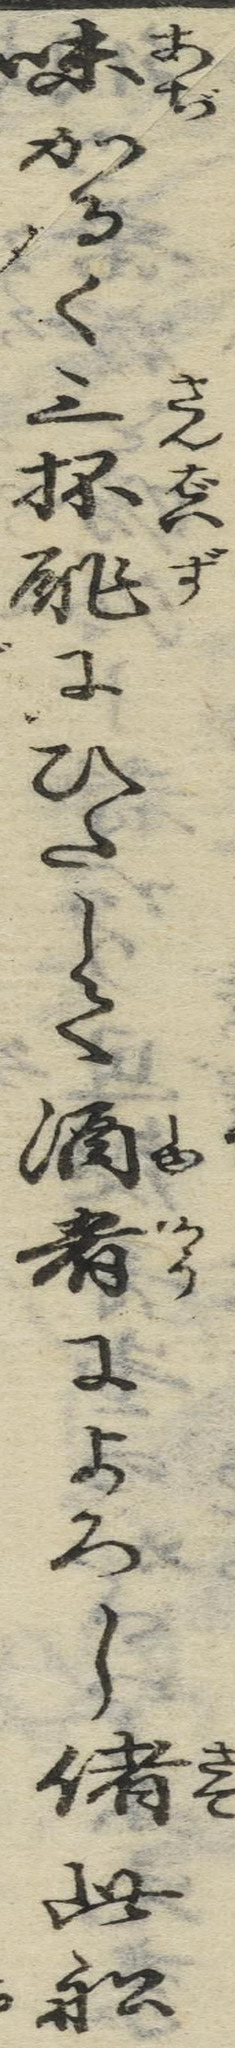味かるく三杯酢にひたして酒肴によろし偖此船
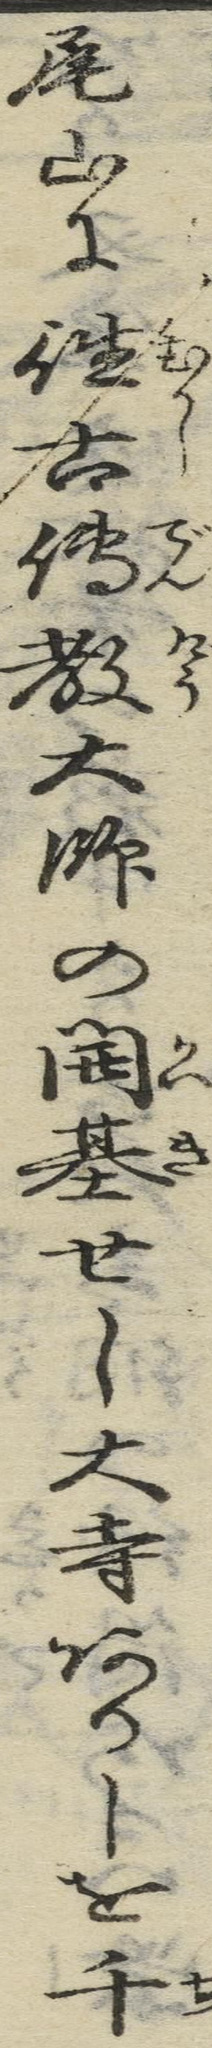尾山に住古傳教大師の開基せし大寺ありしを千
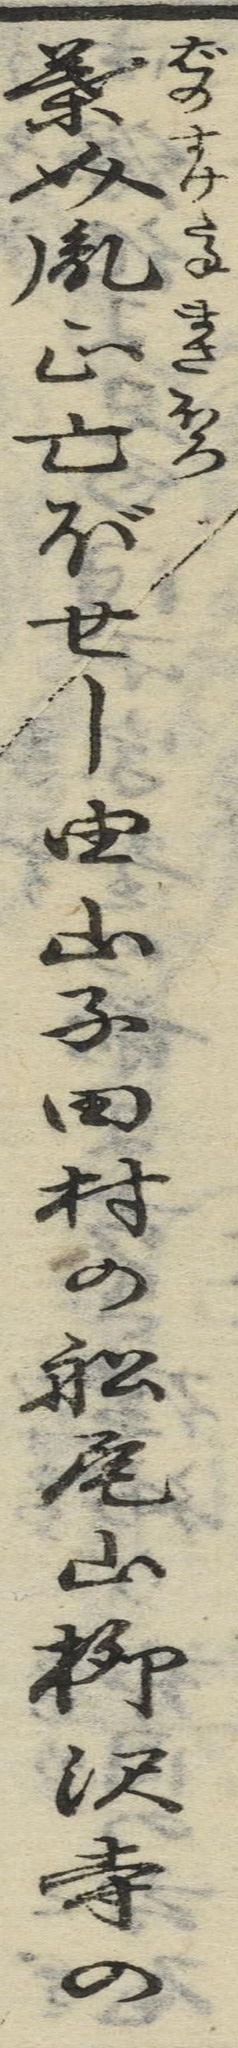葉介胤正亡びせし由山子田村の船尾山柳沢寺の
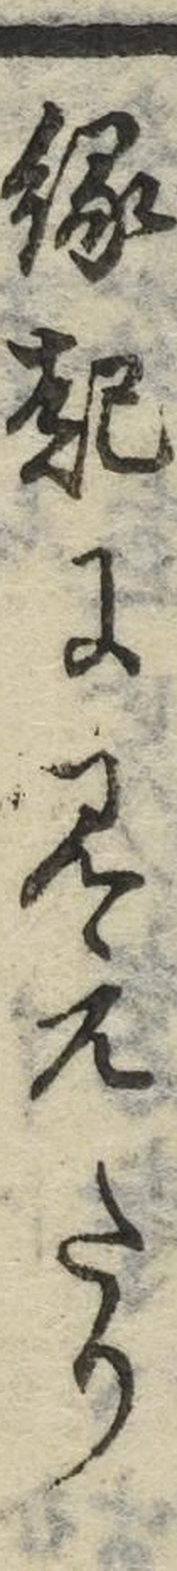縁起に見えたり
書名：上州伊香保鑛泉圖會　全
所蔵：東京大学地震研究所図書室 Earthquake Research Institute Library, The University of Tokyo, JAPAN
